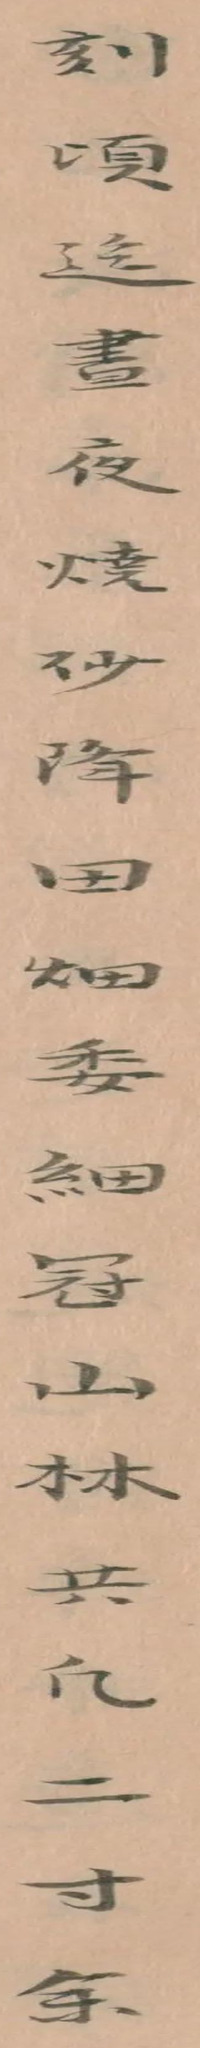刻頃迄晝夜焼砂降田畑委細冠山林共凡二寸余
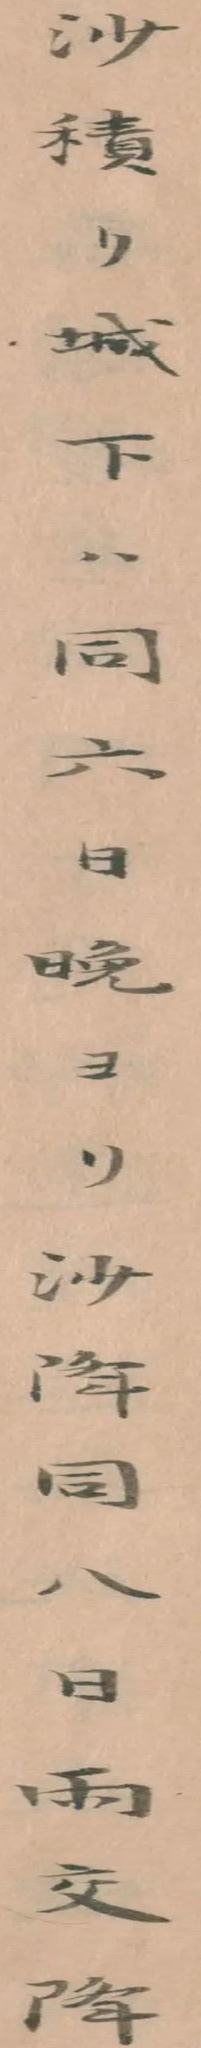砂積り城下ハ同六日晩ヨリ砂降同八日雨交降
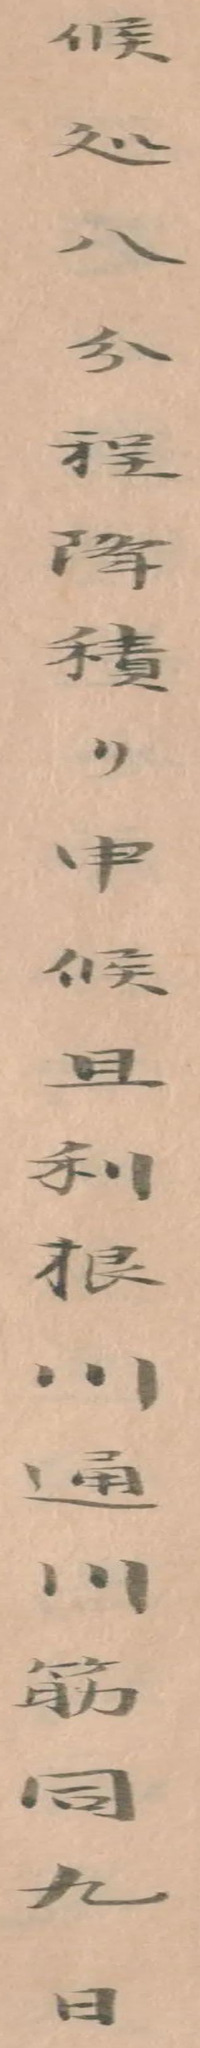候処八分程降積り申候且利根川通川筋同九日
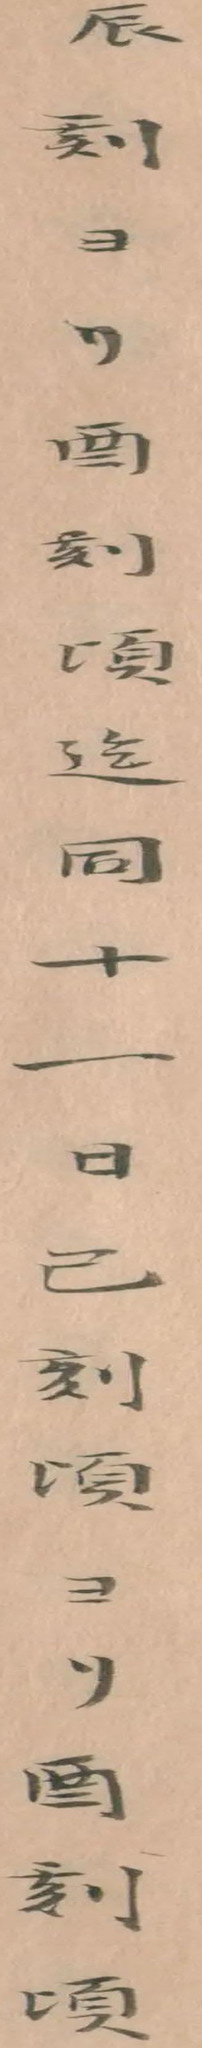辰刻ヨリ酉刻頃迄同十一日巳刻頃ヨリ酉刻頃
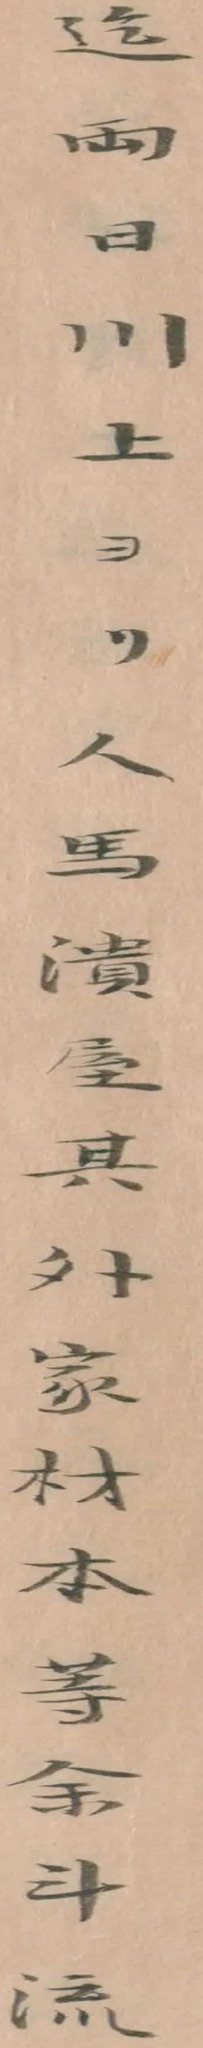迄両日川上ヨリ人馬潰屋其外家材本等余斗流
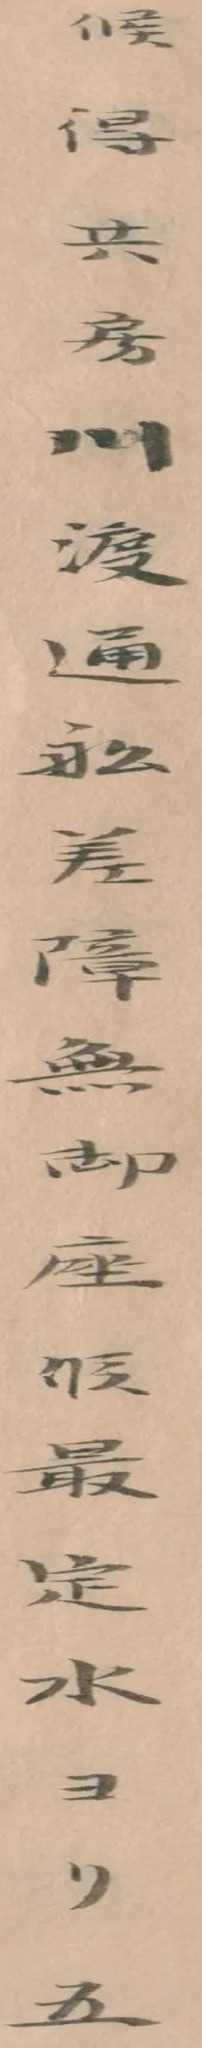候得共房川渡通船差障無御座候最定水ヨリ五
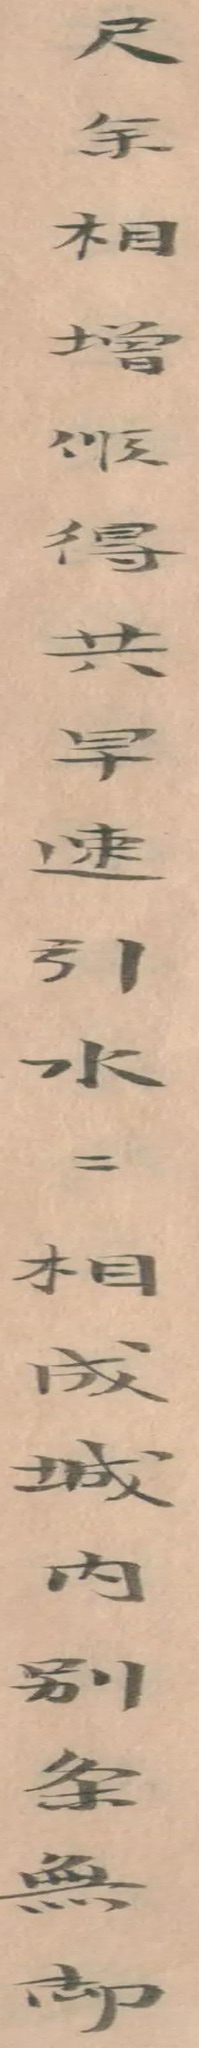尺余相増候得共早速引水二相成城内別条無御

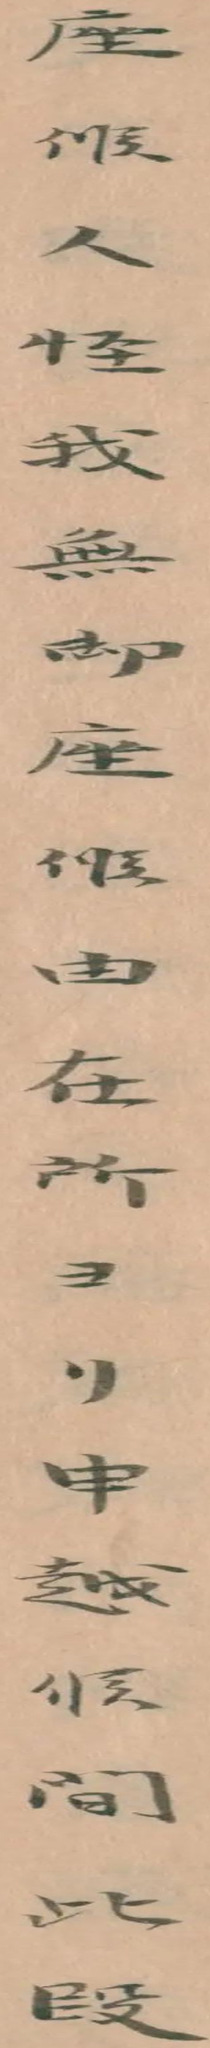座候人怪我無御座候由在所ヨリ申越候間此段
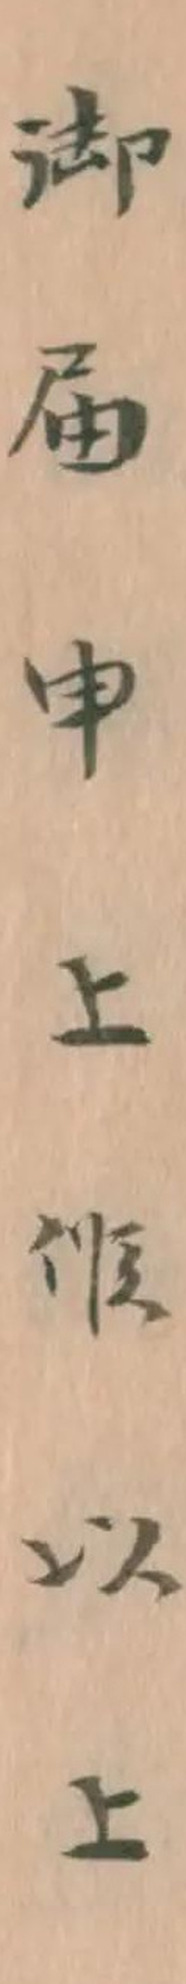御届申上候以上
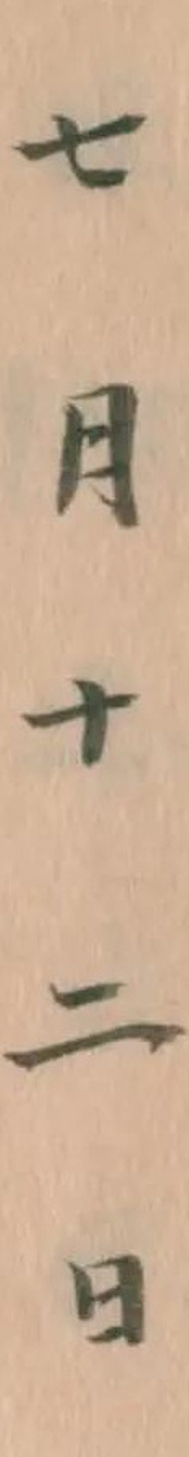七月十二日
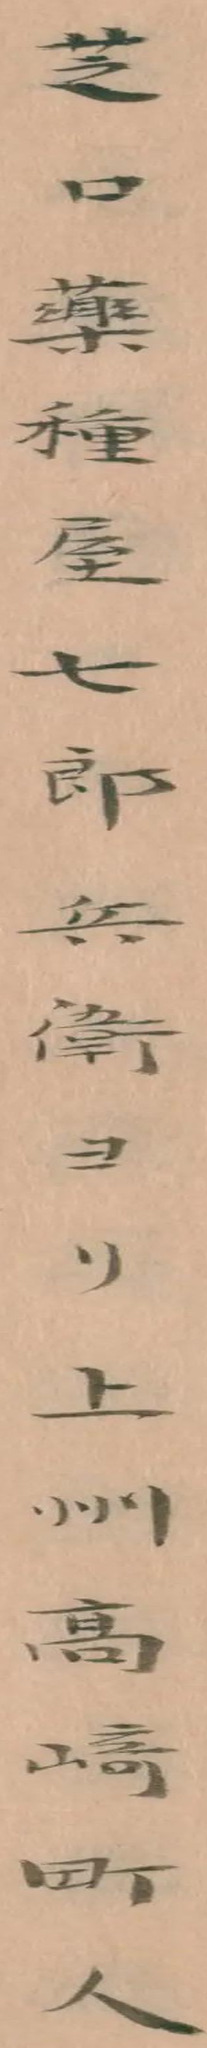芝口薬種屋七郎兵衛ヨリ上州高崎町人
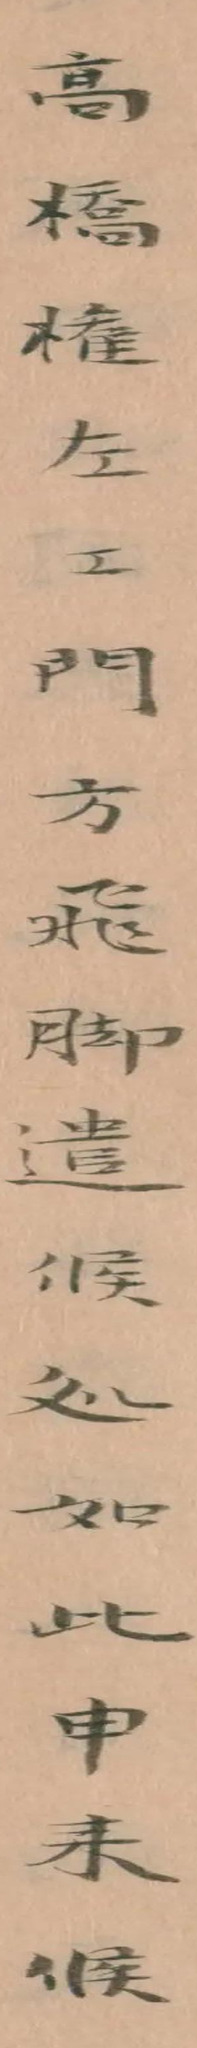高橋権左衛門方飛脚遣候処如此申来候
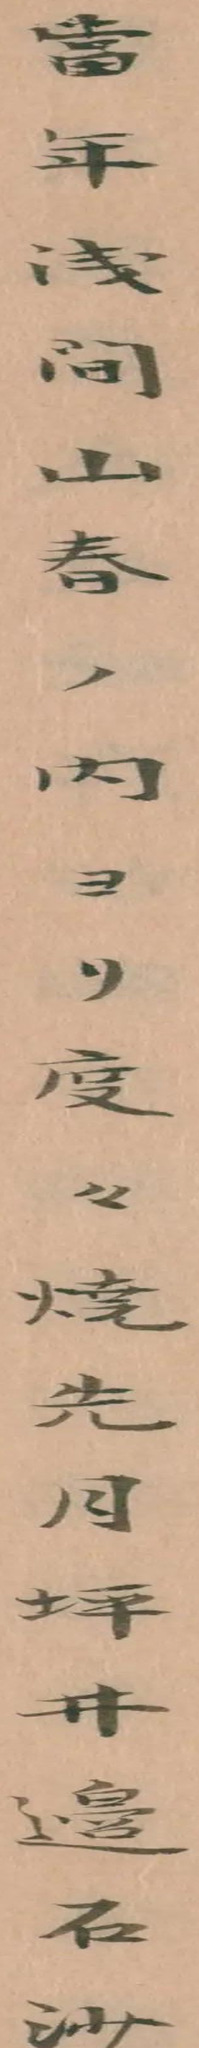当年浅間山春ノ内ヨリ度々焼先月坪井辺石沙
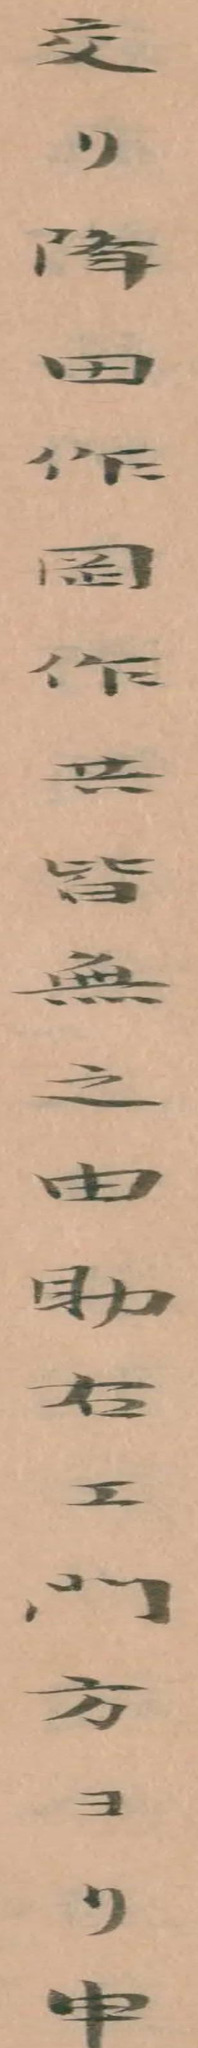交り降田作岡作共皆無之由助右衛門方ヨリ申
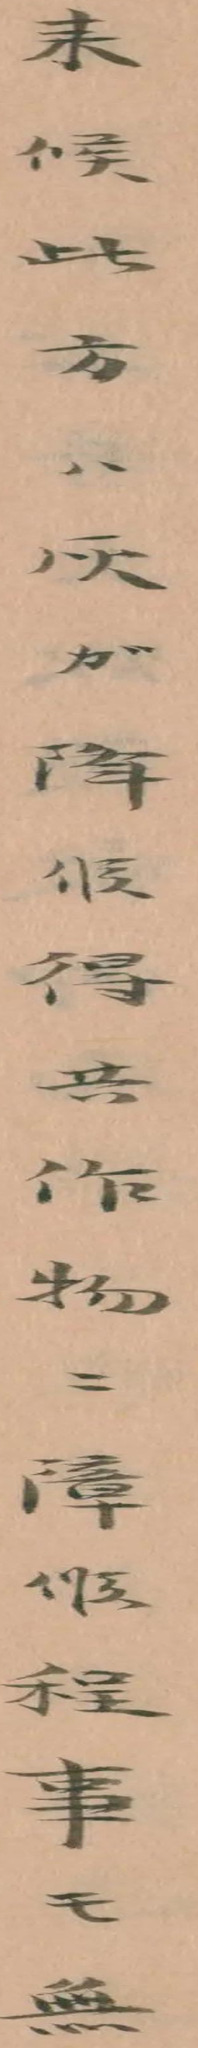来候此方ハ灰ガ降候得共作物二障候程事モ無
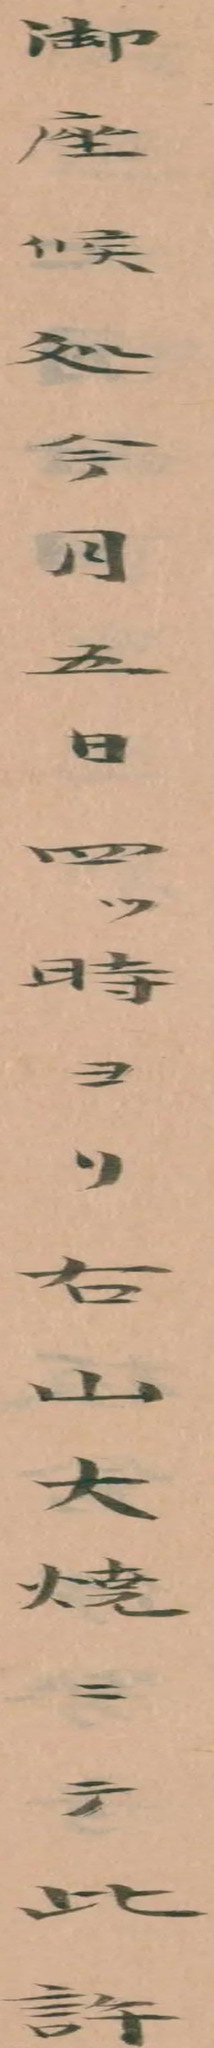御座候処今月五日四ッ時ヨリ右山大焼ニテ此許
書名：地災撮要. 巻1(噴火山・地震ノ部)
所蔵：国立国会図書館 National Diet Library, JAPAN
